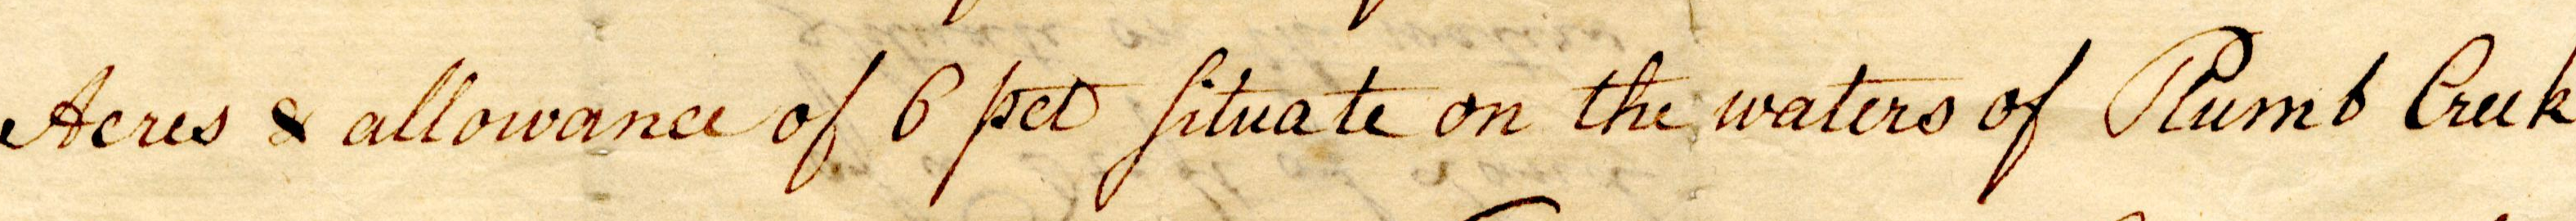Acres & allowance of 6 pct situate on the waters of Plumb Creek
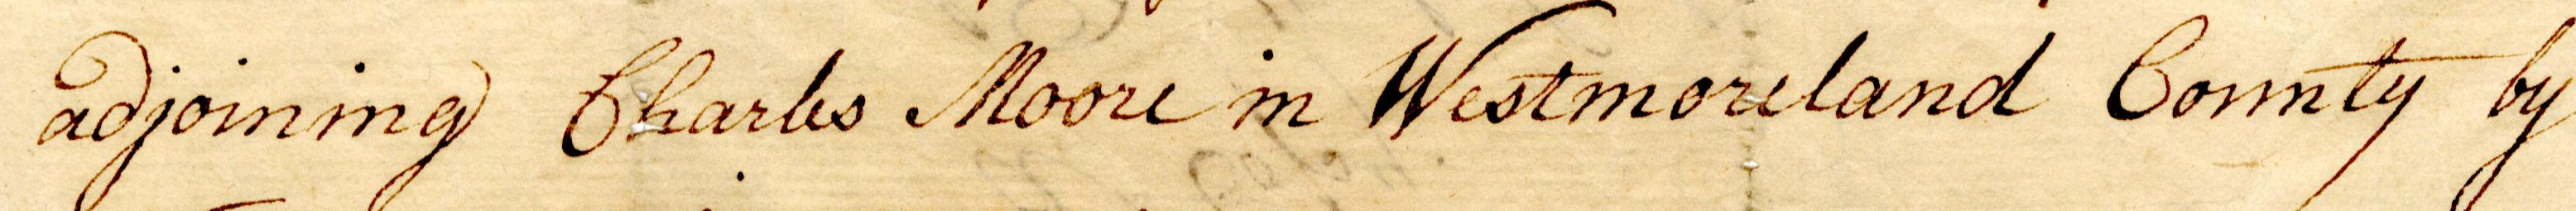adjoining Charles Moore in Westmoreland County by
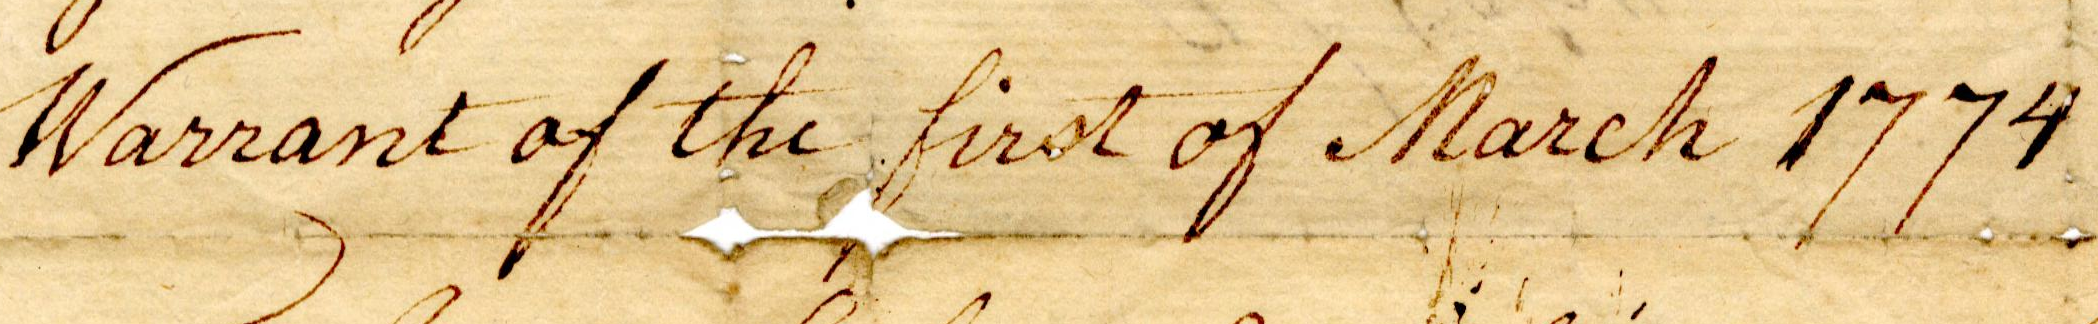Warrant of the first of March 1774
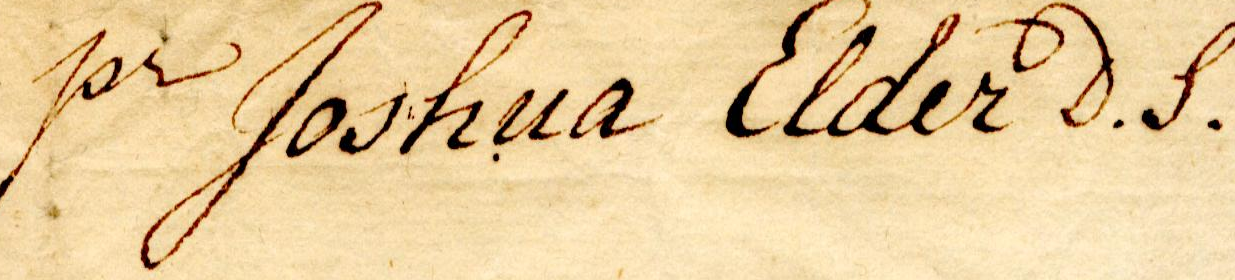p^r Joshua Elder D.S.
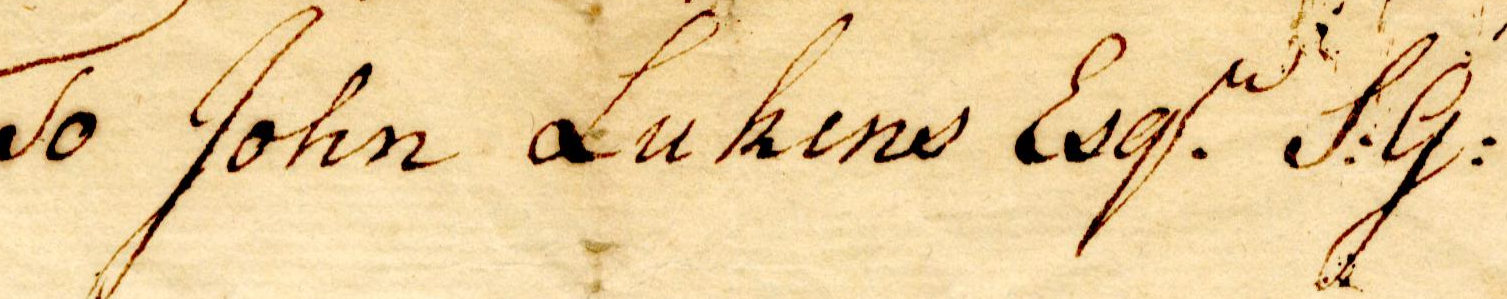To John Lukens Esq^r. S:G:
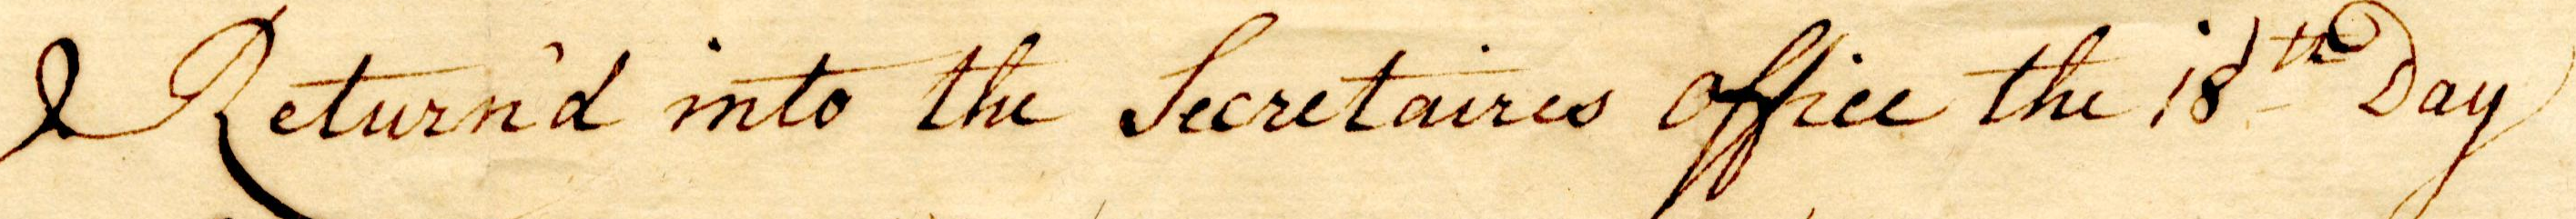& Return'd into the Secretaries office the 18^th Day
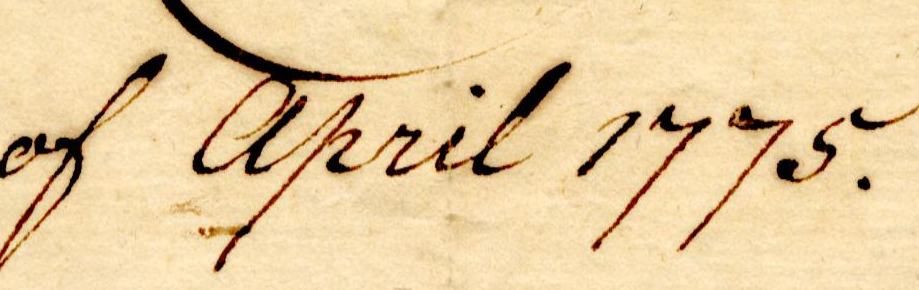of April 1775.
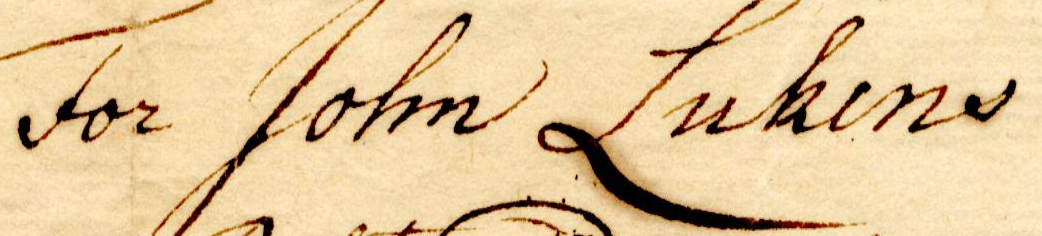For John Lukens
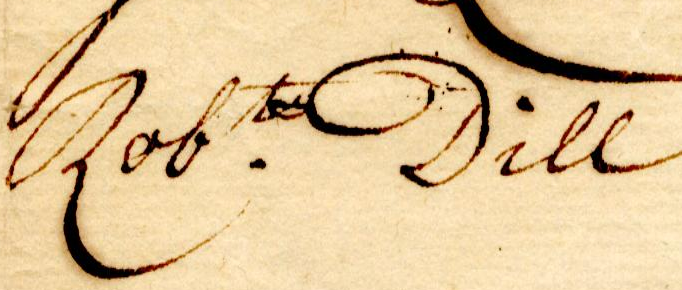Rob^t Dill
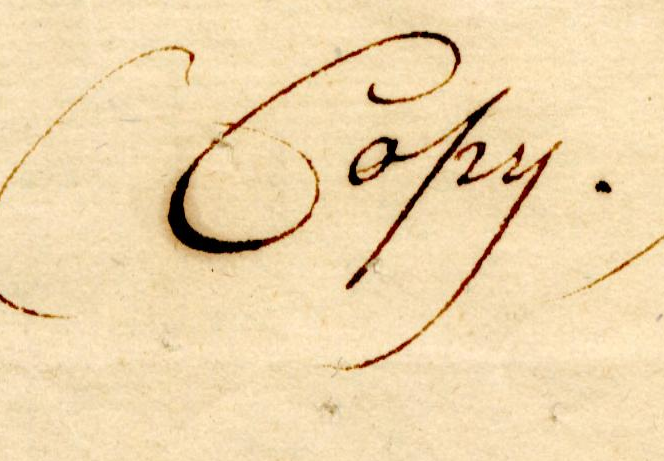(Copy.)
